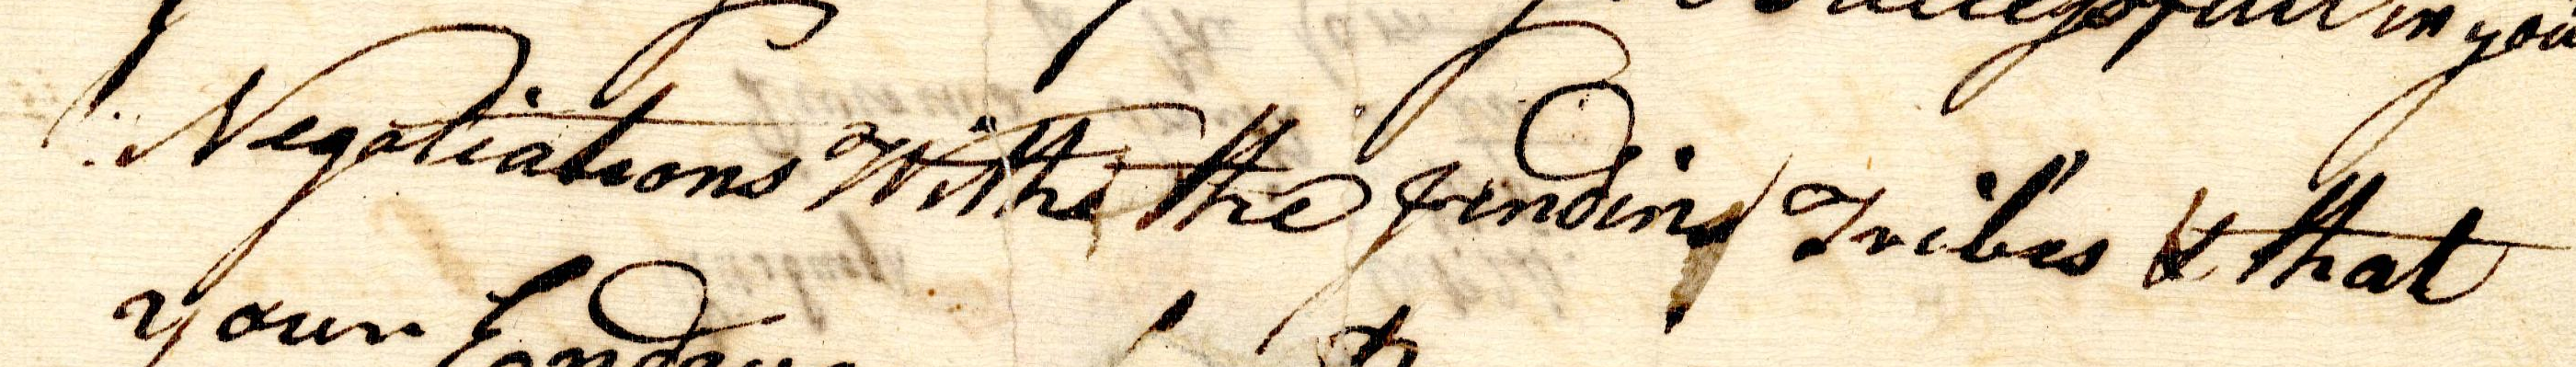Negotiations Withe the Iendin Tribes & that
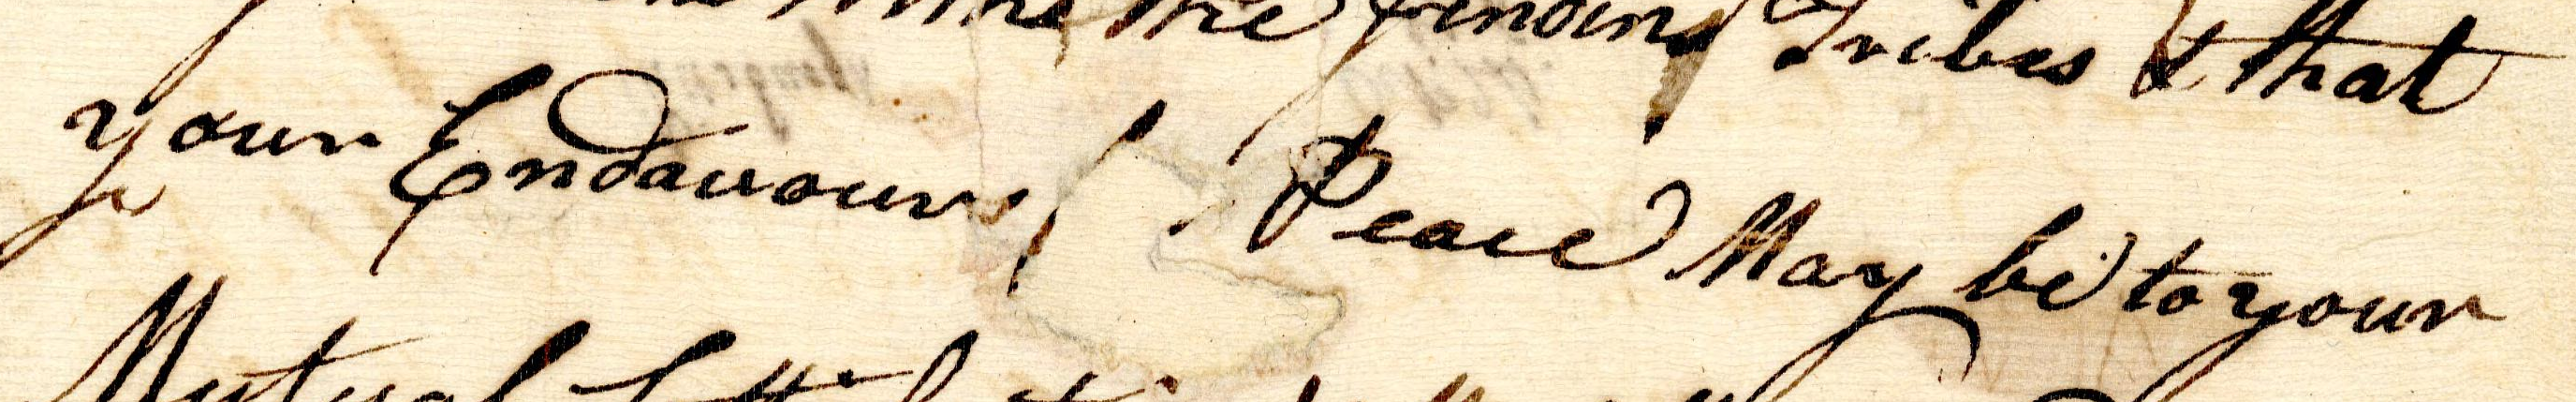Your Endavours/ Peace May be to your
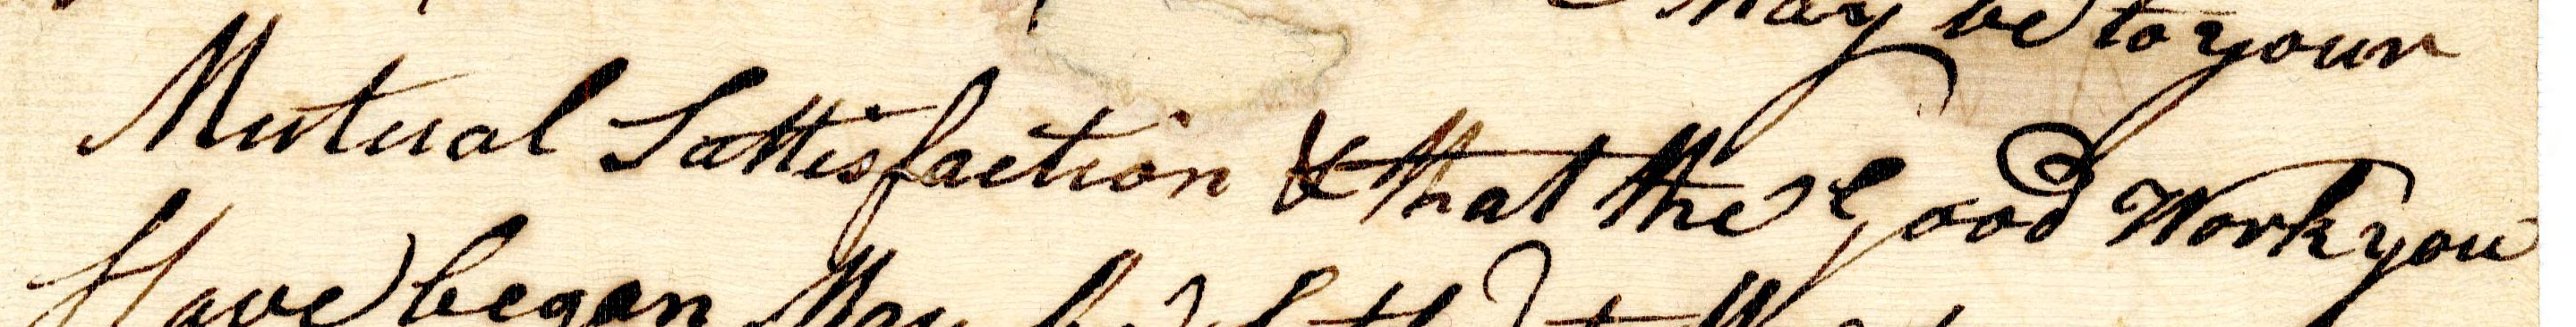Mutual Sattisfaction & that the Good Work you
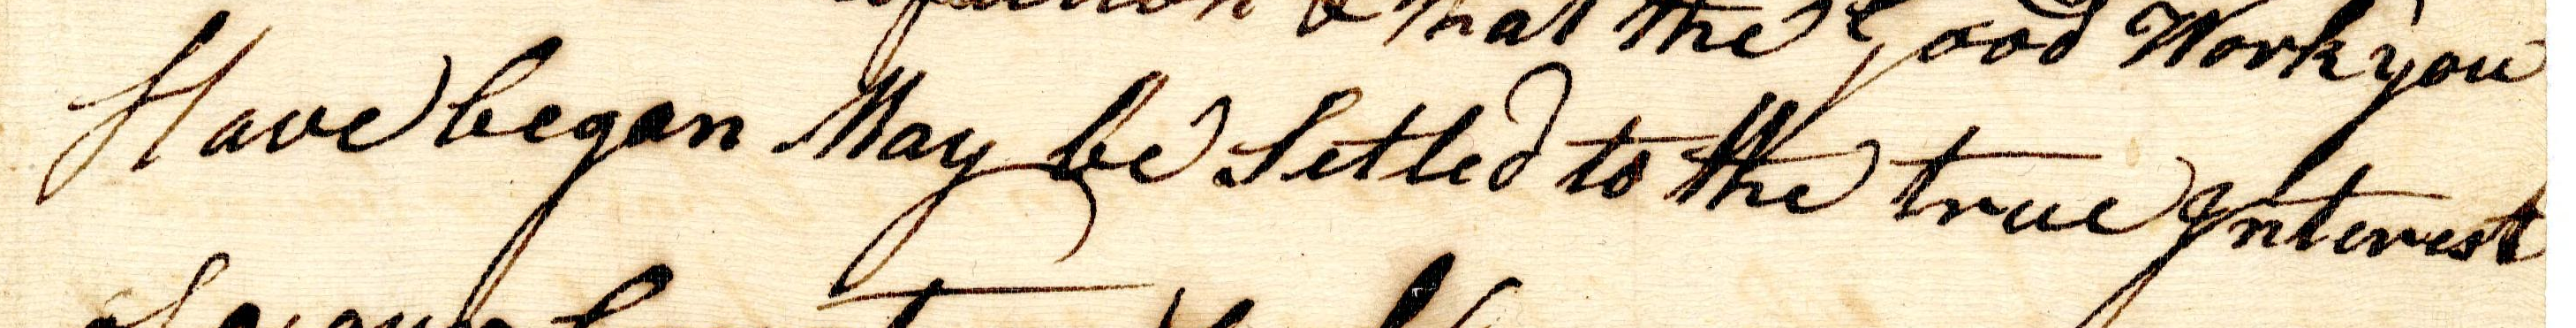Have began May be Setled to the true Interest
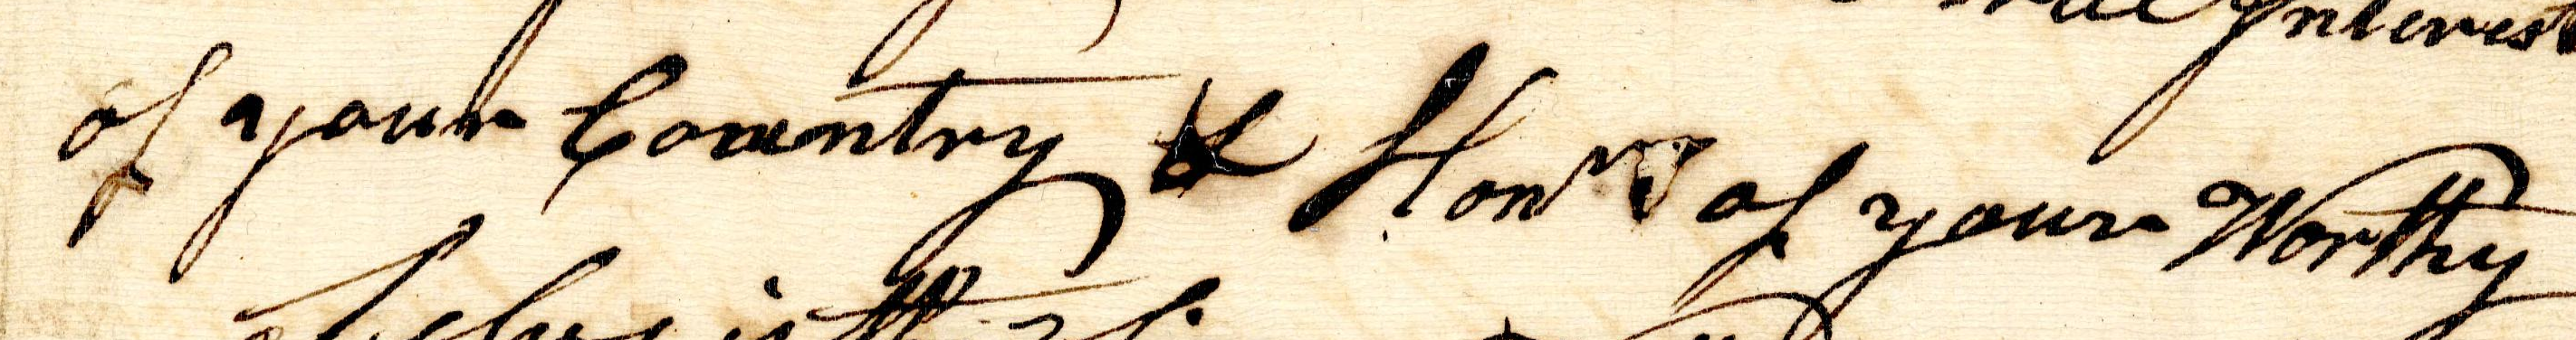of your Country & Hon^r. of your Worthy
